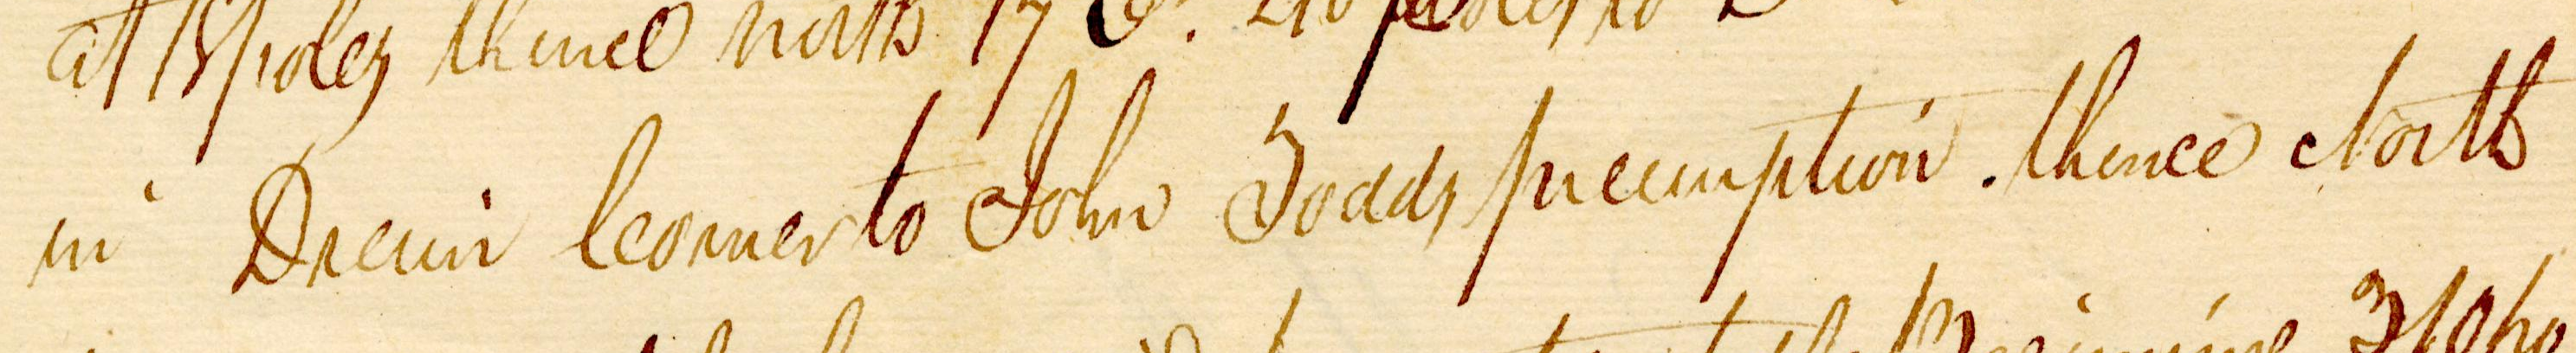in Frain sconer to John Joddy peculation. thence North
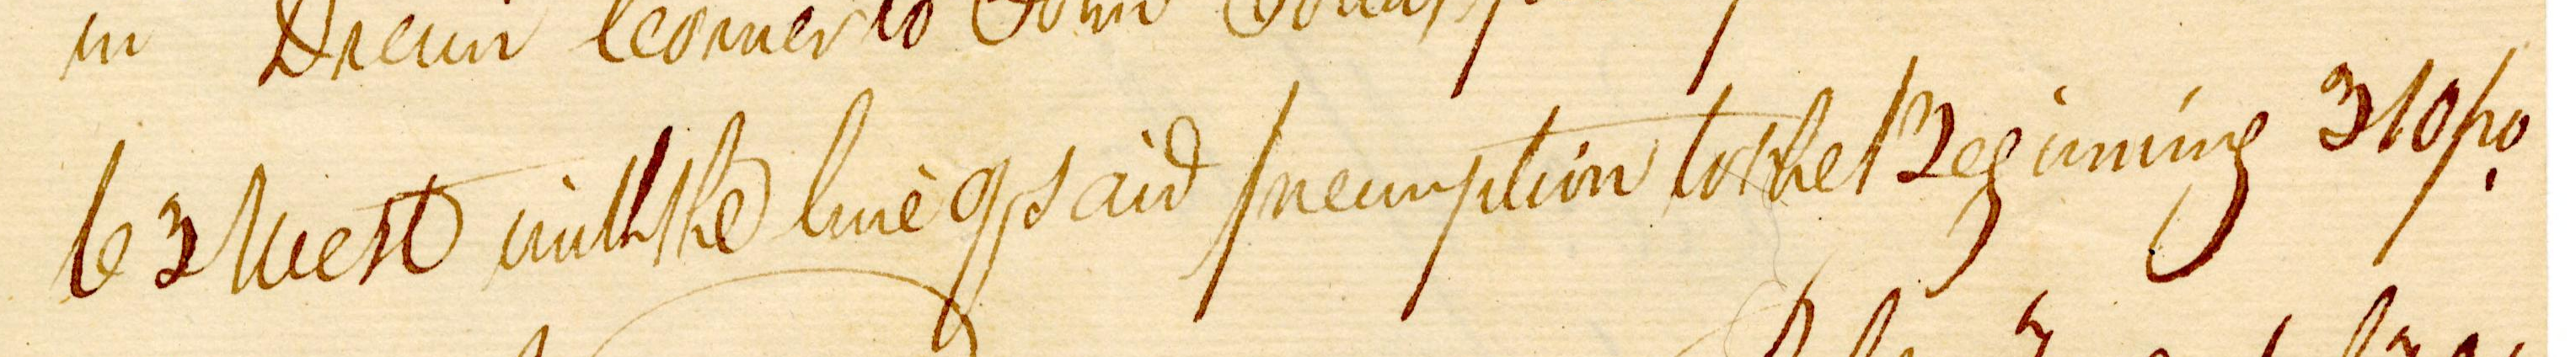63 Next with the line old and temptation for the Beginning 310 po
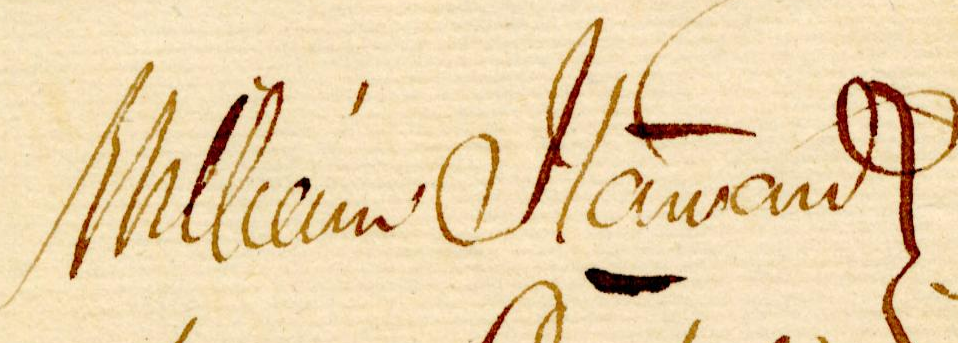William Howard
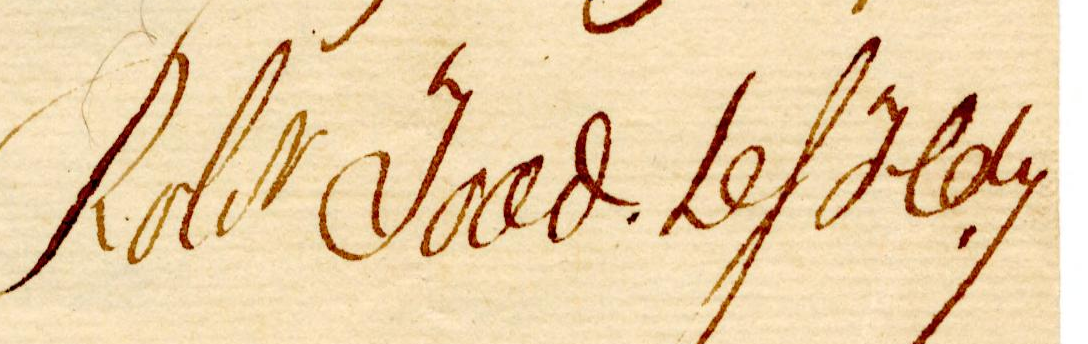Rol^r. Goad. Left 254
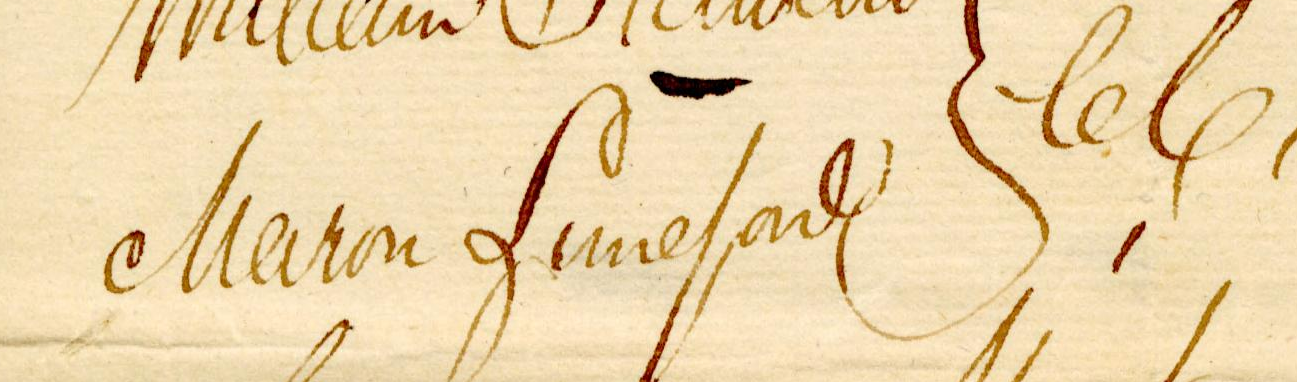Mason Fineland 66,
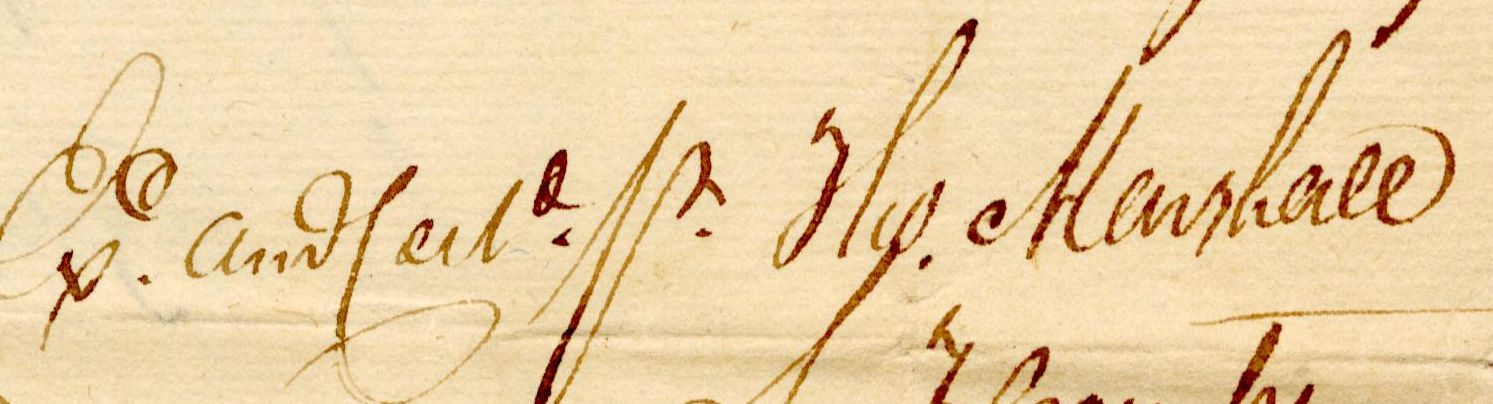Ex^d and sent to Hy Henshall
